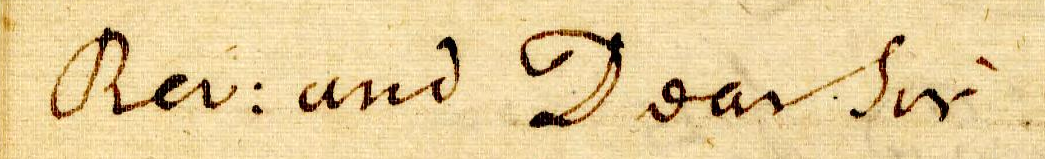Rev: and Dear Sir
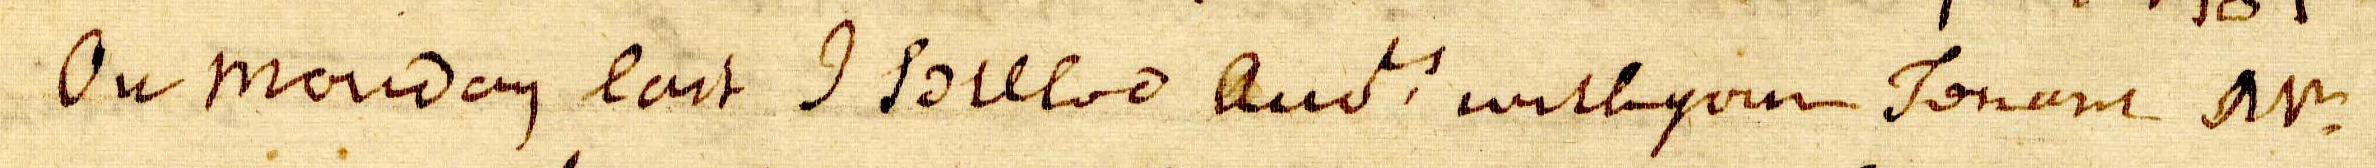On Monday last I settled Acco^ts. with your Tenant M^r.
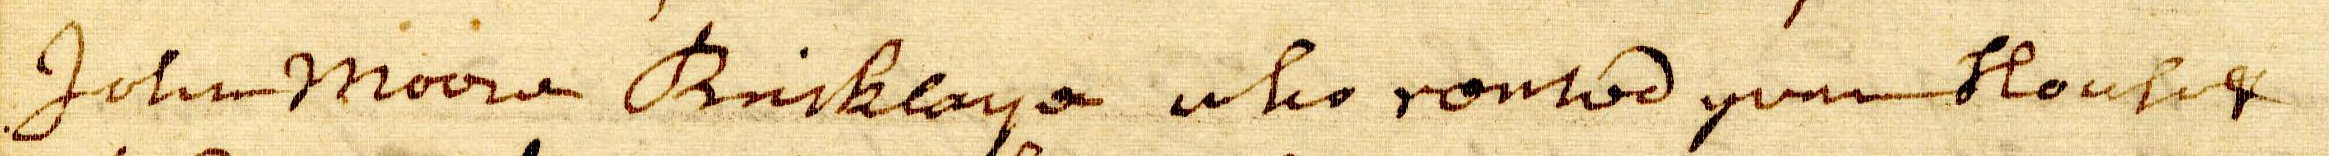John Moore Bricklayer who rented your House &
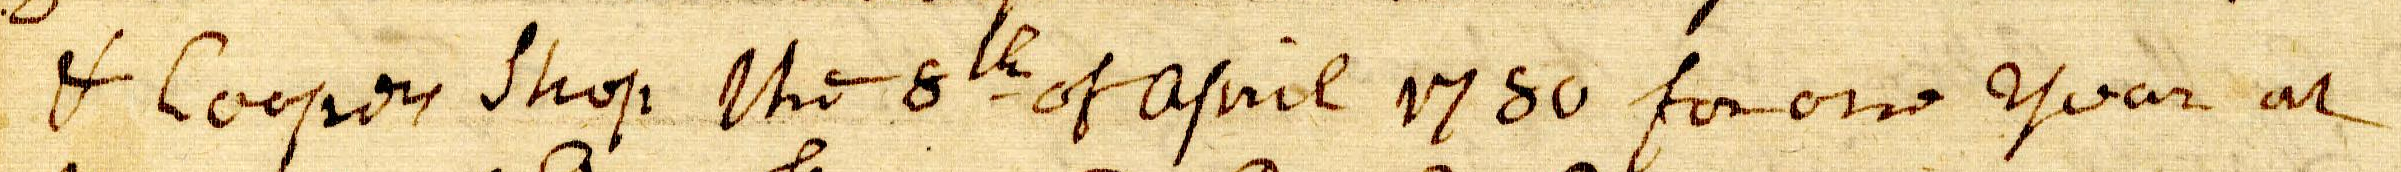& Coopers Shop the 8^th of April 1780 for one Year at
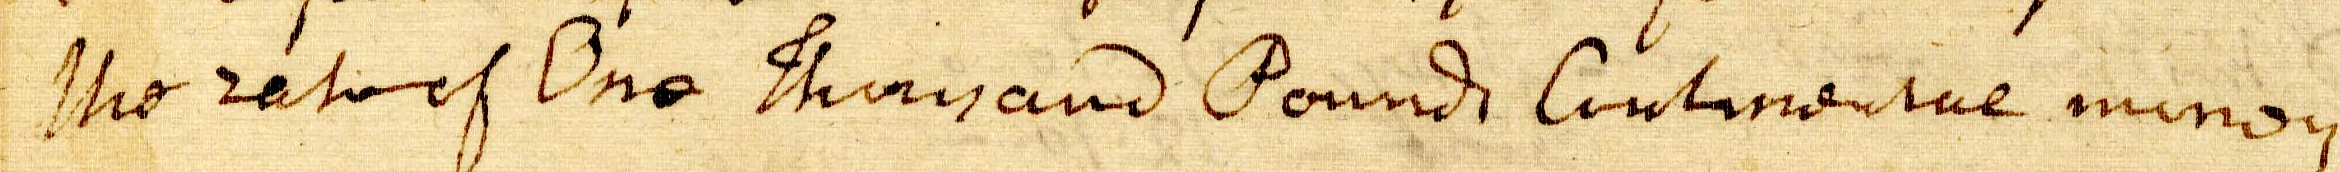the rate of One Thousand Pounds Continental money,
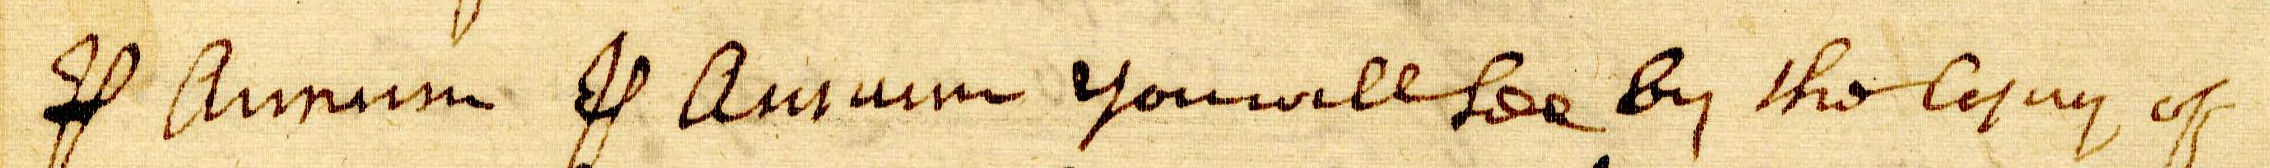per Annum per Annum You will see by the Copy of
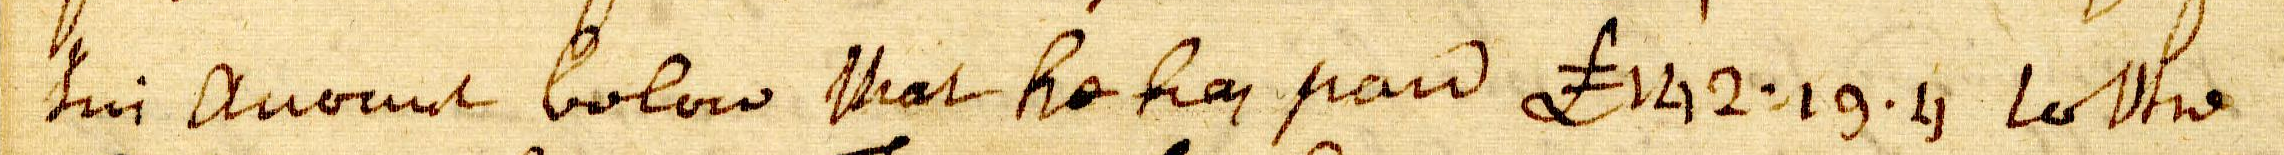his Account below that he has paid £14 2:19.4 to the
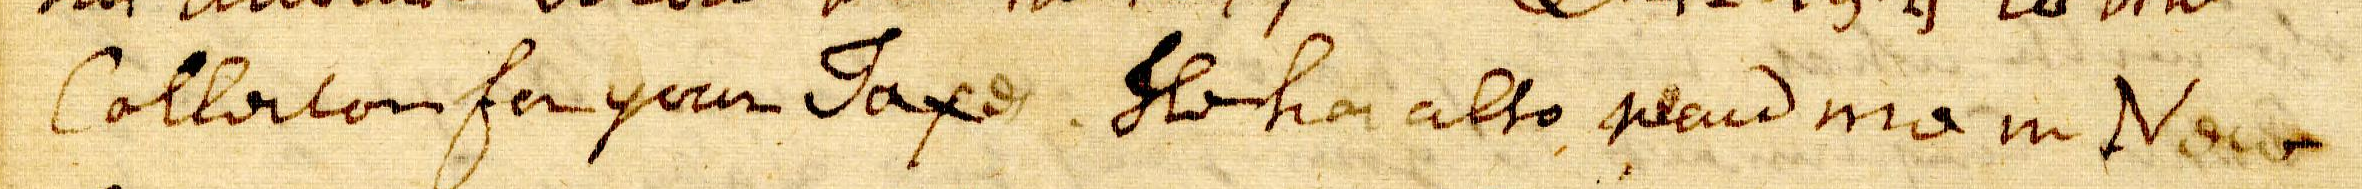Collector for your Taxes. He has also paid me in Now
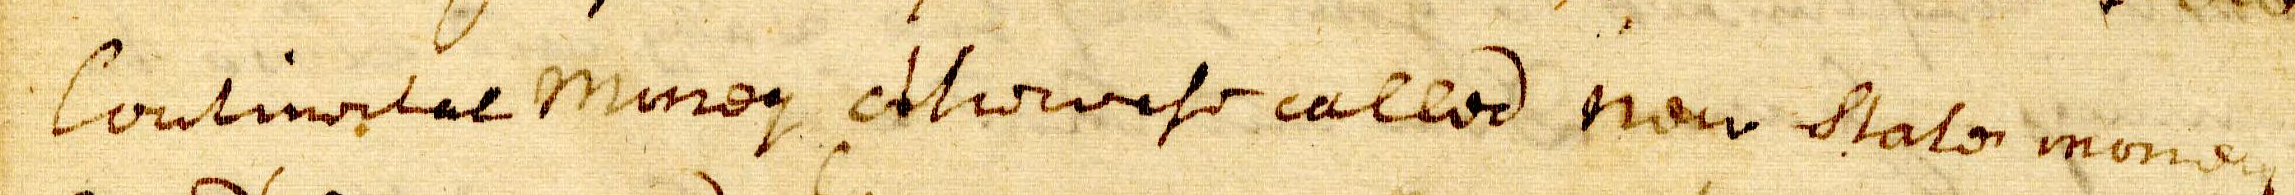Continental Money otherwise called now states money
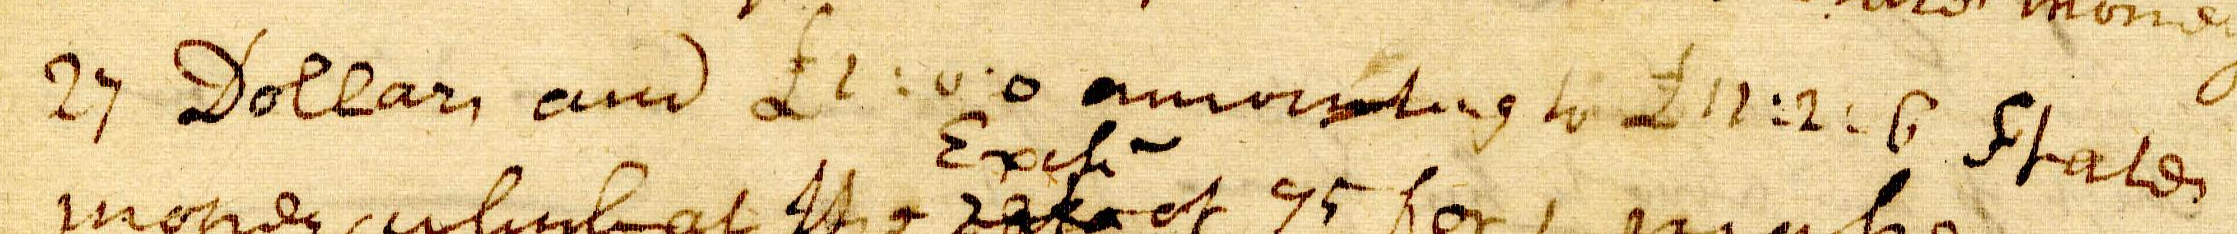27 Dollars and £1:0:0 amounting to £12:2.6. States
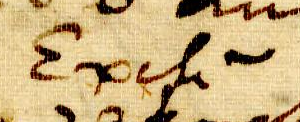Exch-
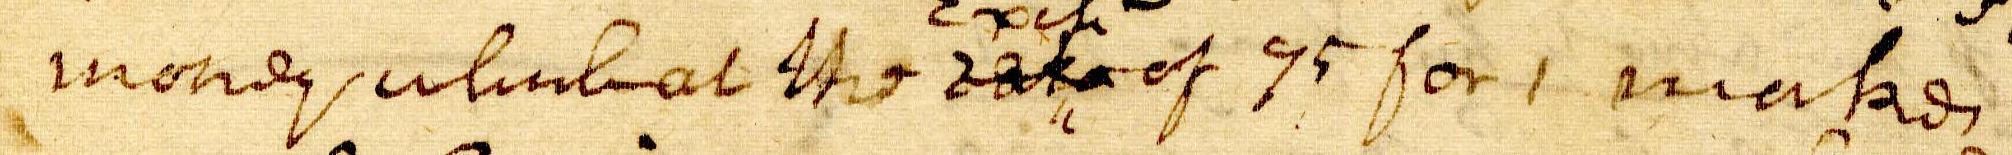money which at the [rate] of 75 for 1 makes
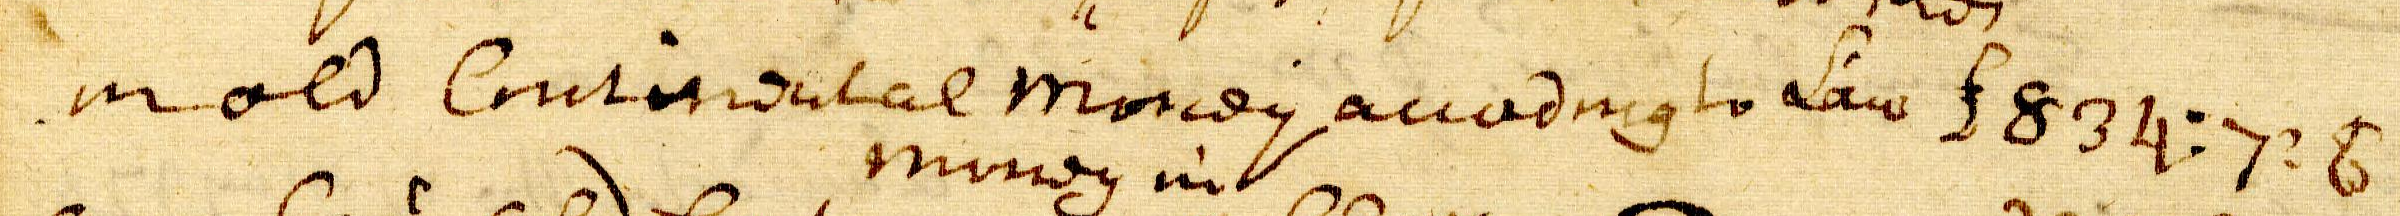in old Continental money according to Law £834:7:8
